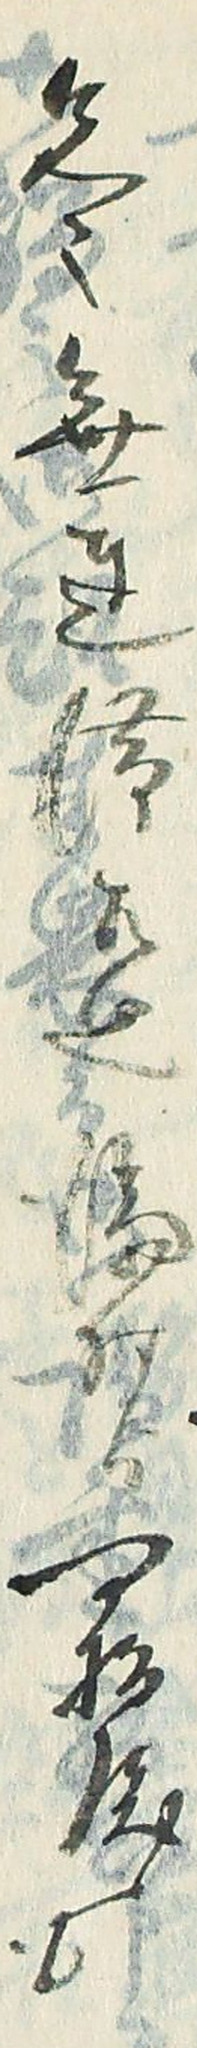先々無遅滞相廻済村ゟ可指戻候以上
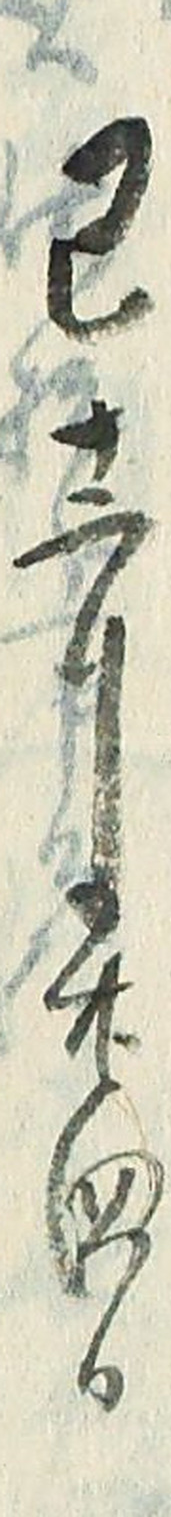巳十二月廿四日
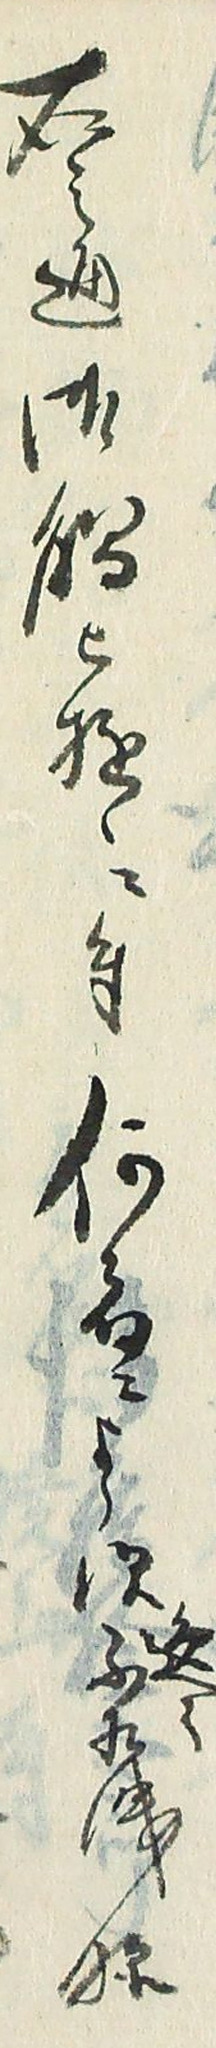右之通御触被遊候に付何者によらす逸々不相洩様
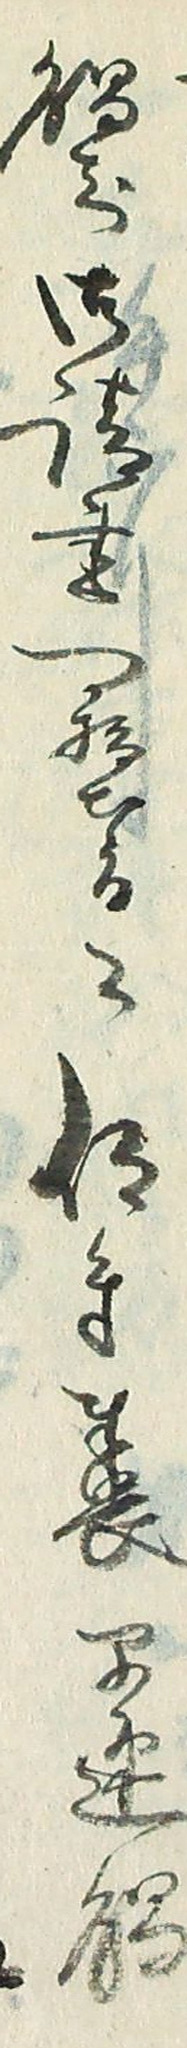触知御請書可指出旨被仰付奉畏早速触
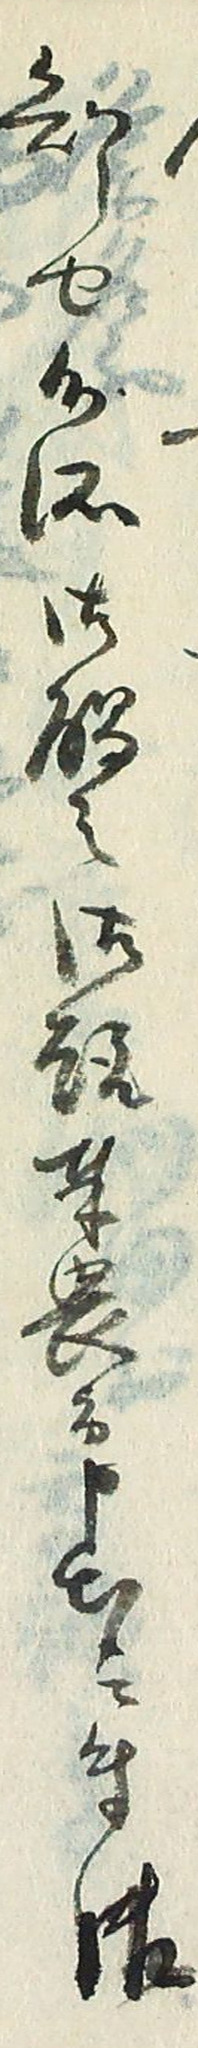知らせ候所御触之御趣奉畏候旨申出候に付御
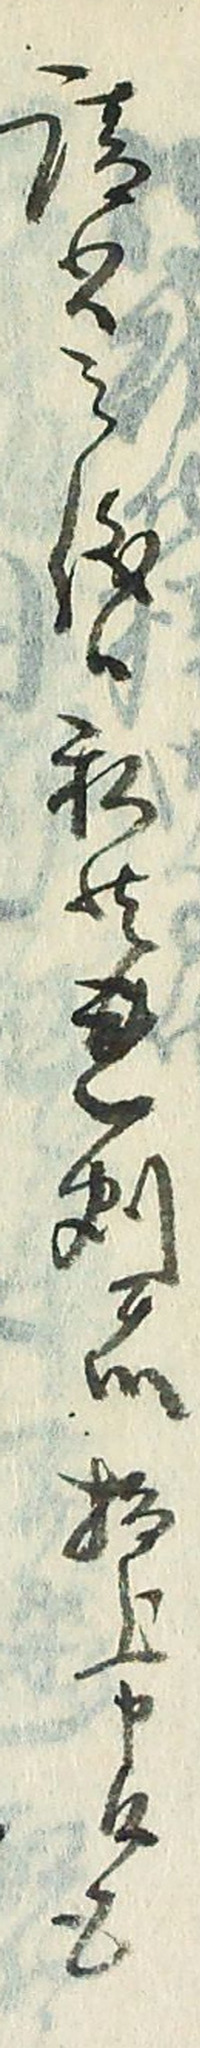請書之儀は私共連判を以指上申候以上
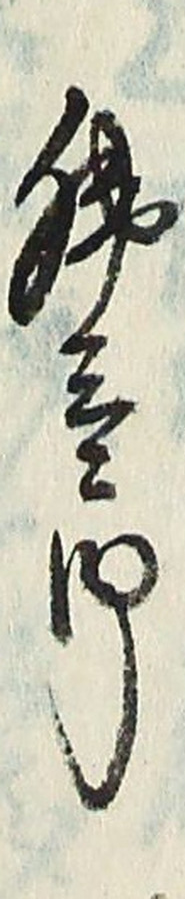虎三郎
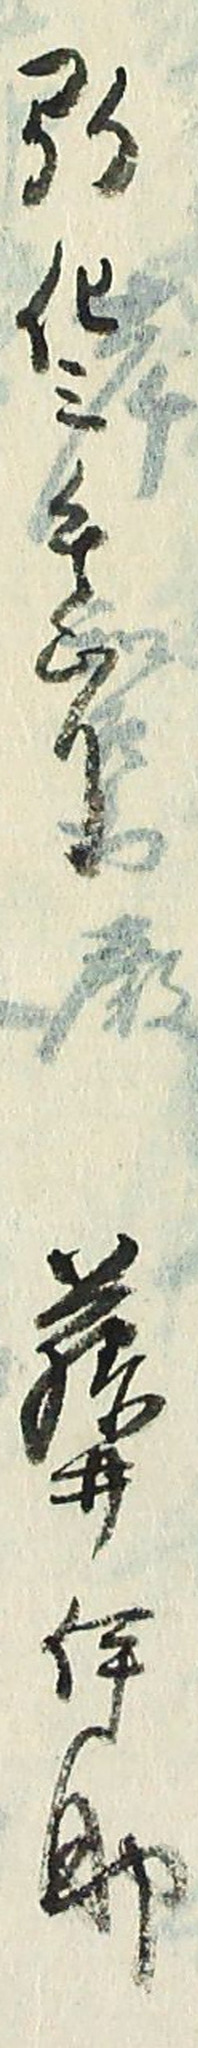弘化三午正月藤井伊助
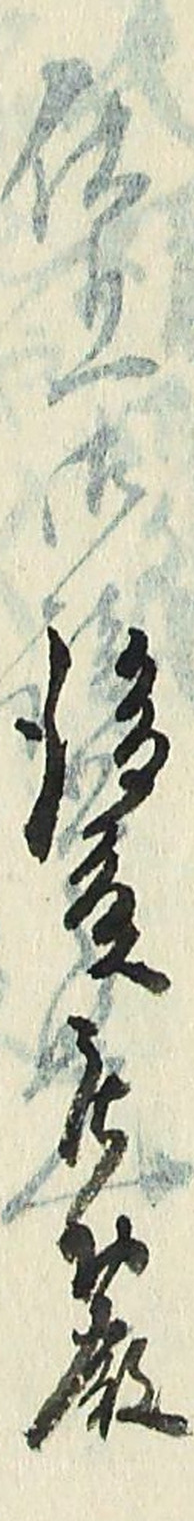後藤庄助殿
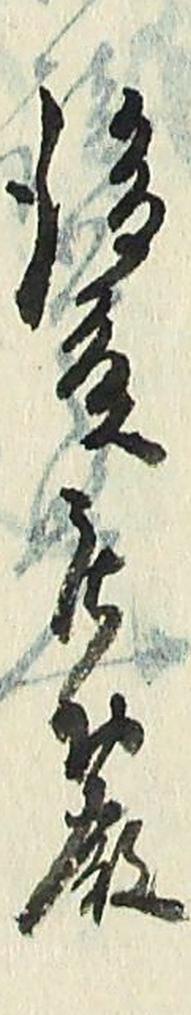後藤庄助殿
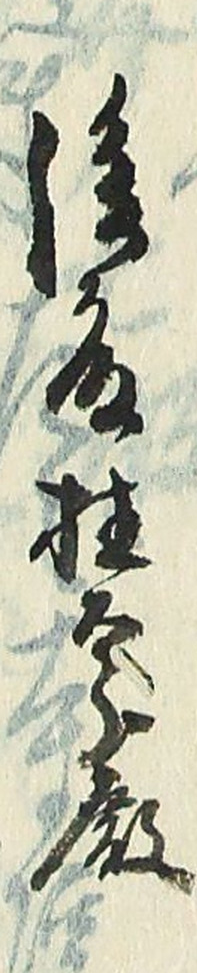後藤桂太郎殿
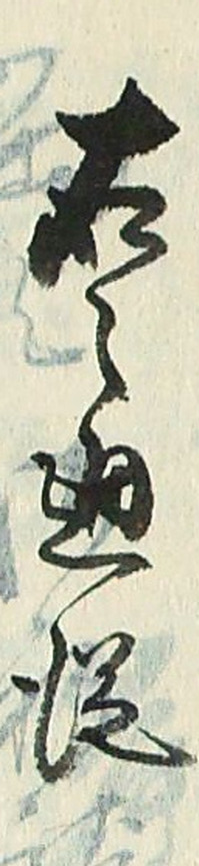右之通従
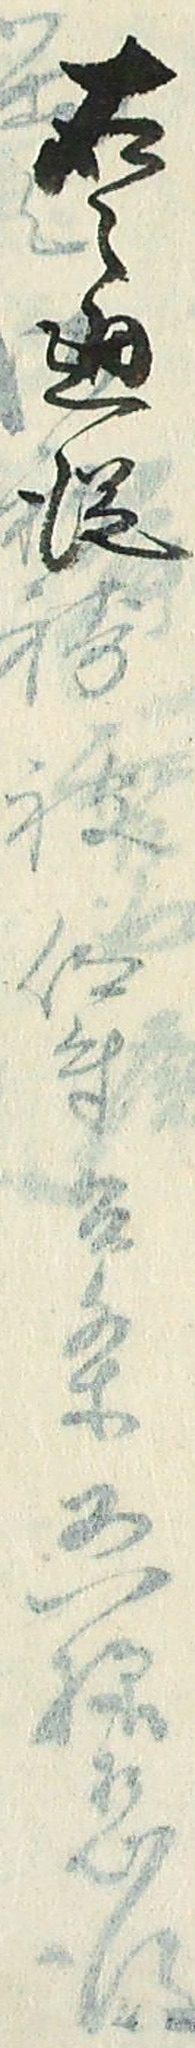右之通従
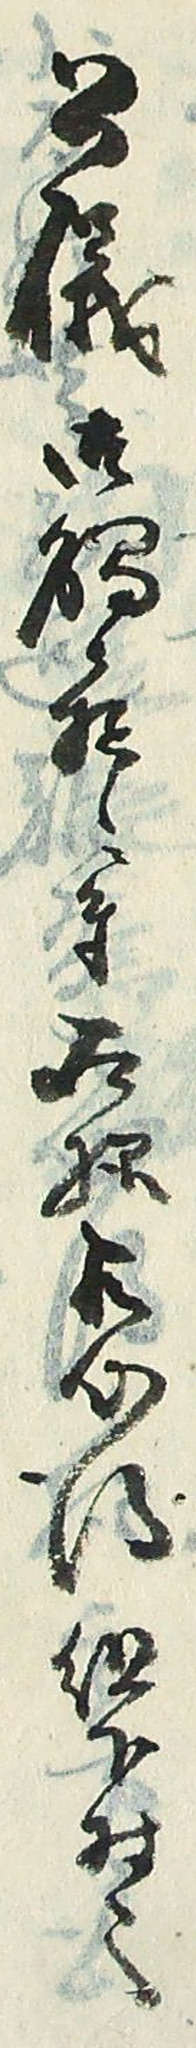公儀御触被遊候に付右様相心得組下村々

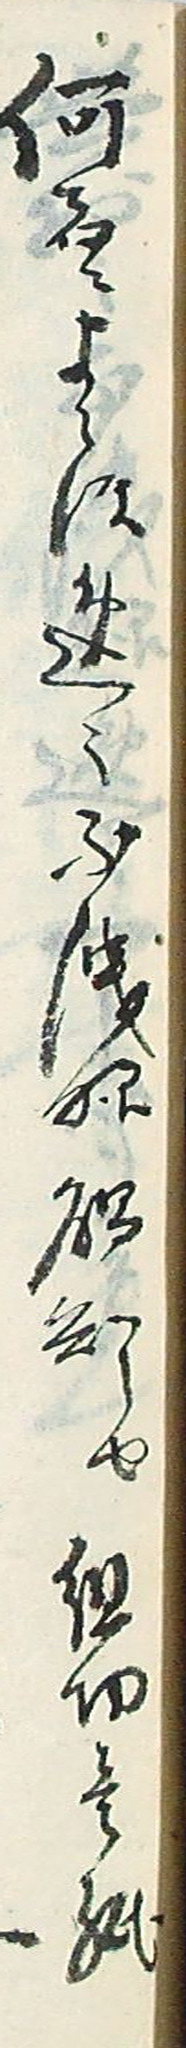何者によらす逸々不洩様触知らせ組切壱紙
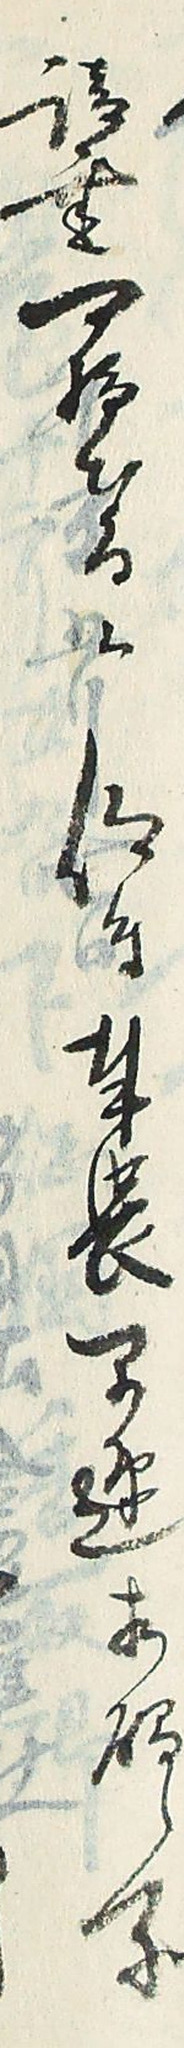請書可指出旨被仰付奉畏相触候所
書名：諸御用御□受書控
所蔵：鳴門教育大学 Naruto University of Education
